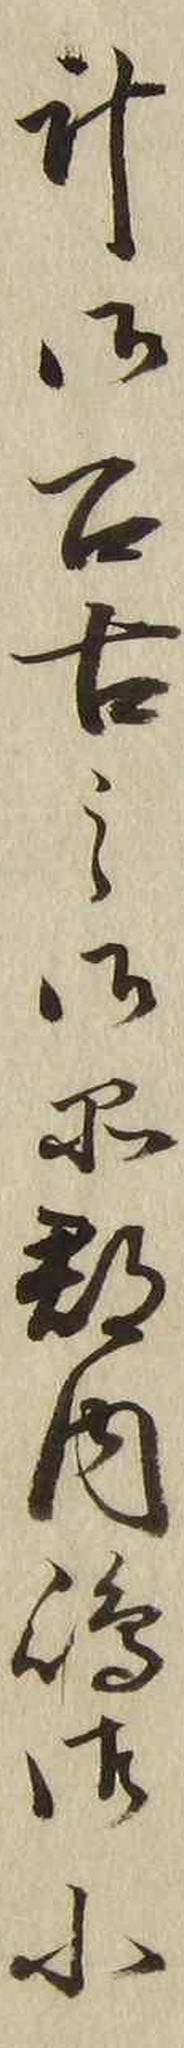計御召古之御品郡内嶋御小
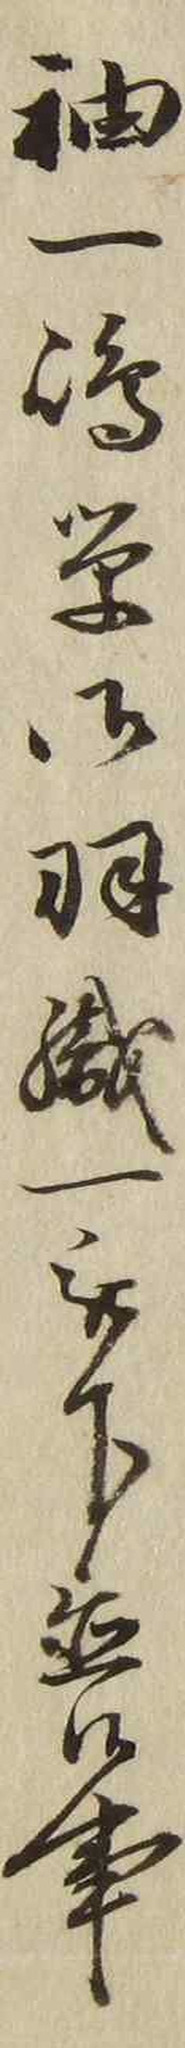袖一嶋単御羽織一被下置候事

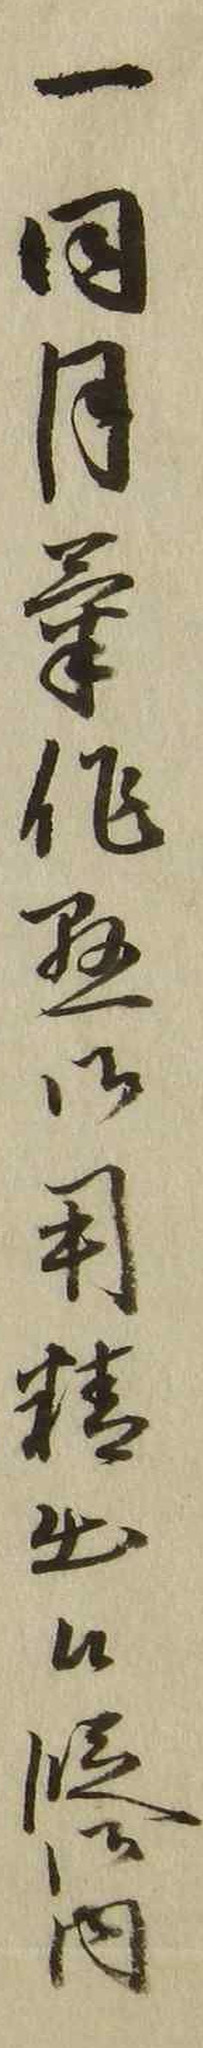一同月菊作懸御用精出候段御内
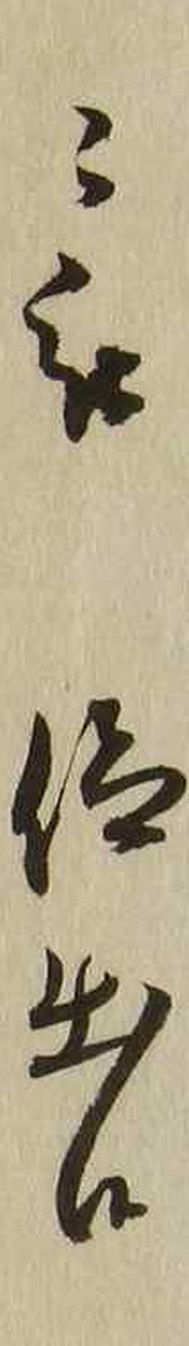々被仰出候
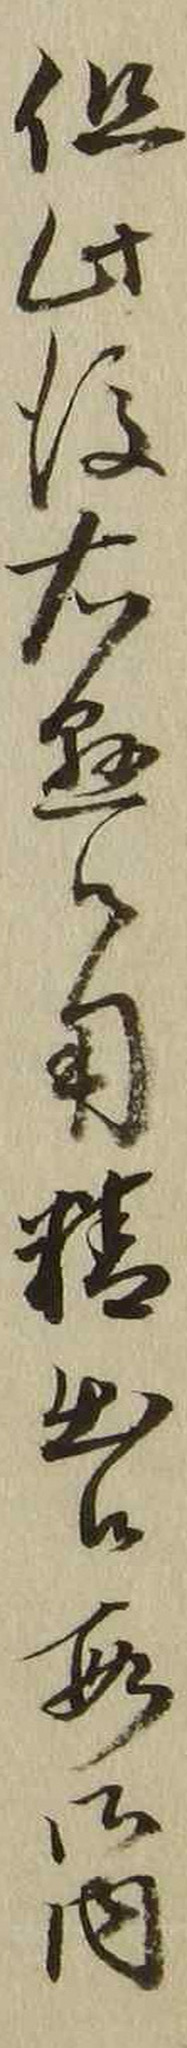但此後右懸御用精出候段御内
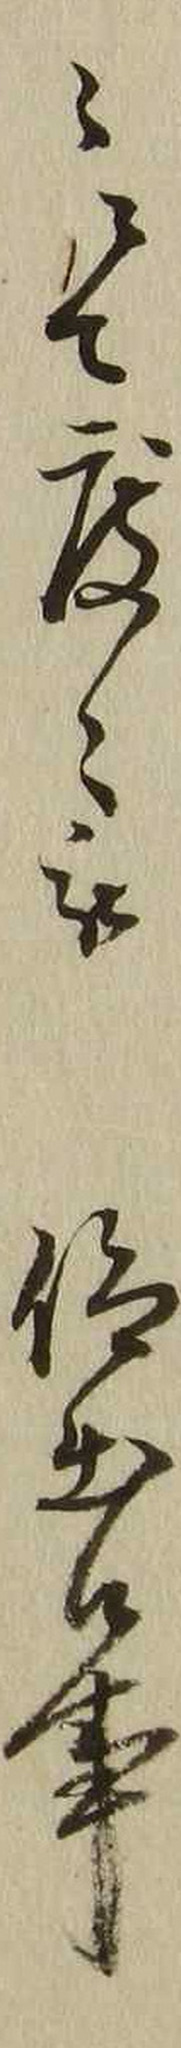々ニて度々被仰出候事
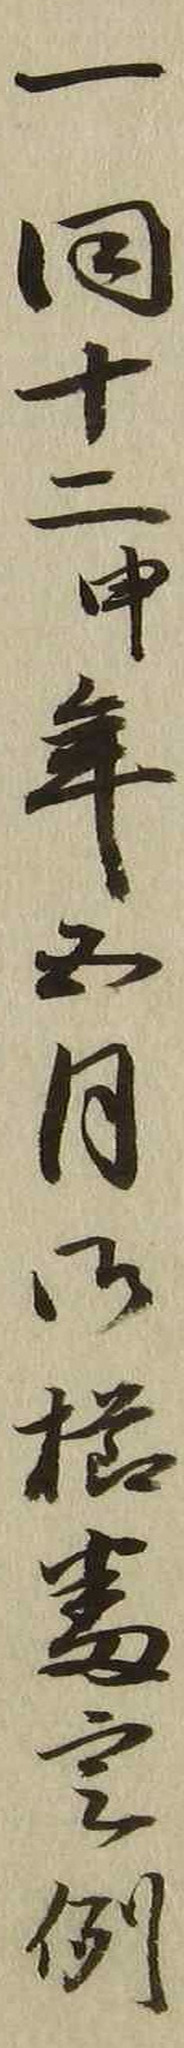一同十二申年五月御櫛番定例
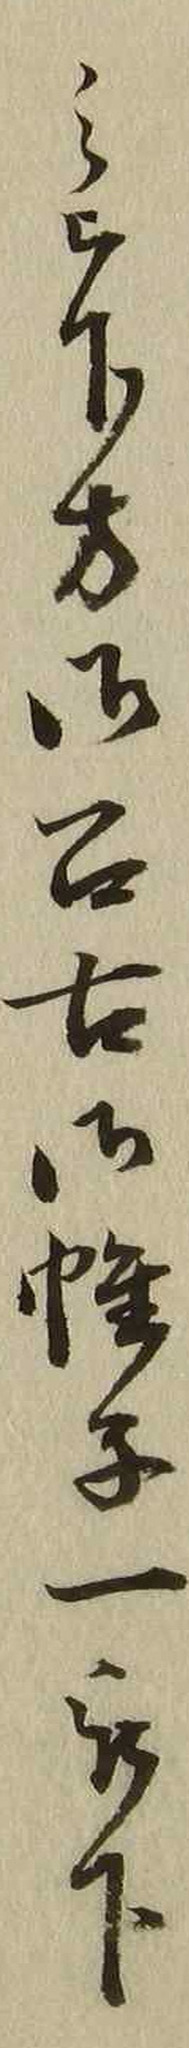之被下方御召古御帷子一被下
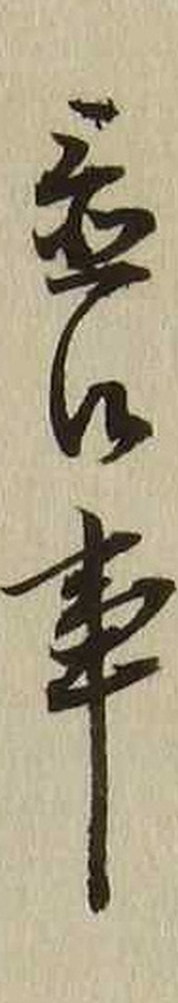置候事
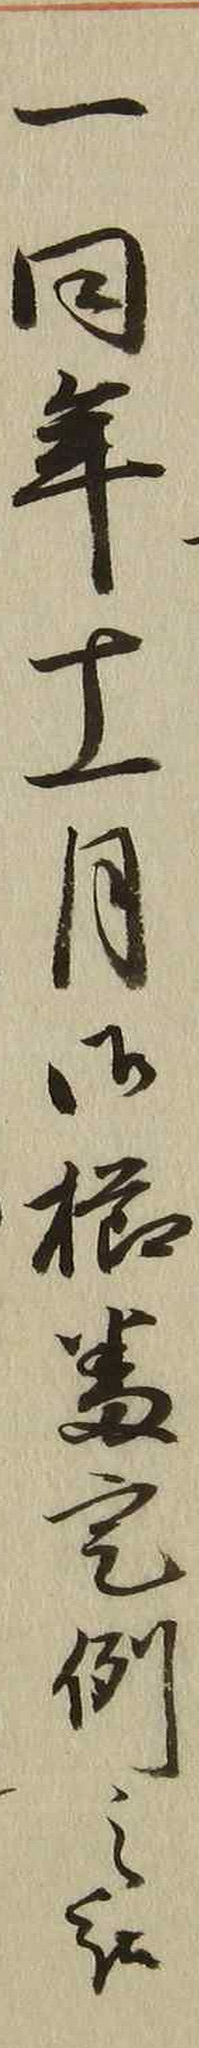一同年十一月御櫛番定例之被
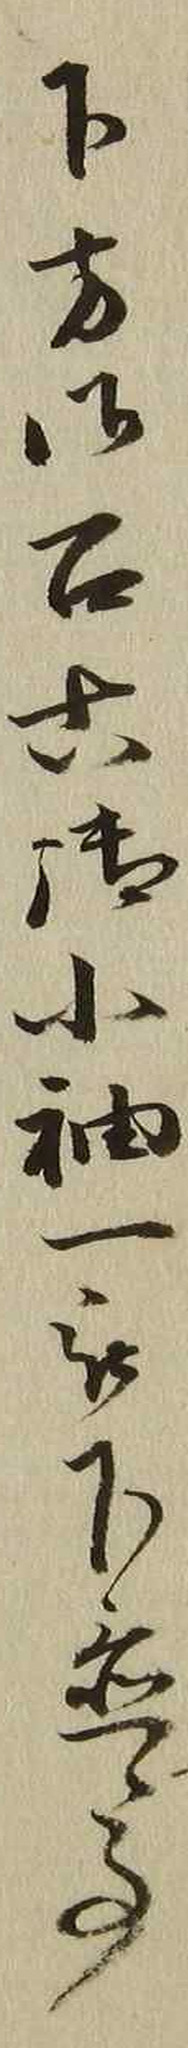下方御召古御小袖一被下置候事
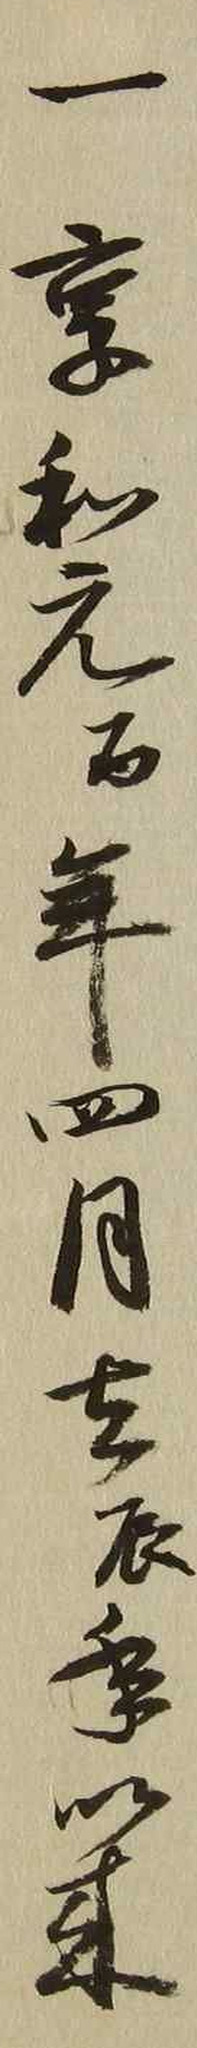一享和元酉年四月去辰年以来
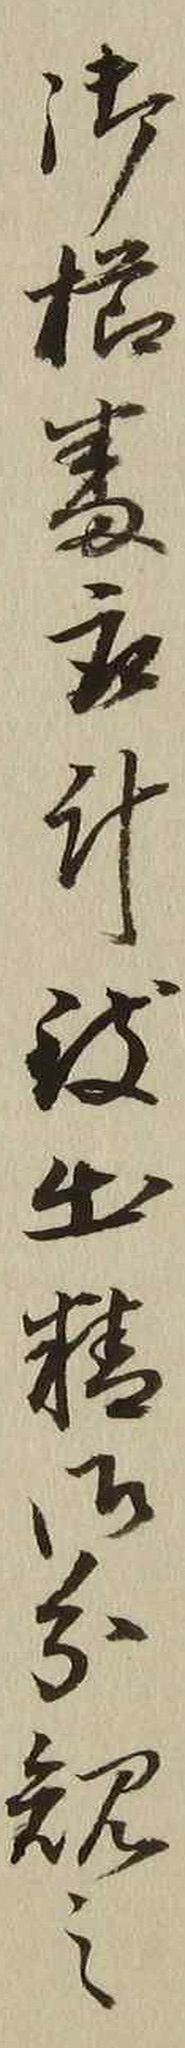御櫛番取計致出精御分規之
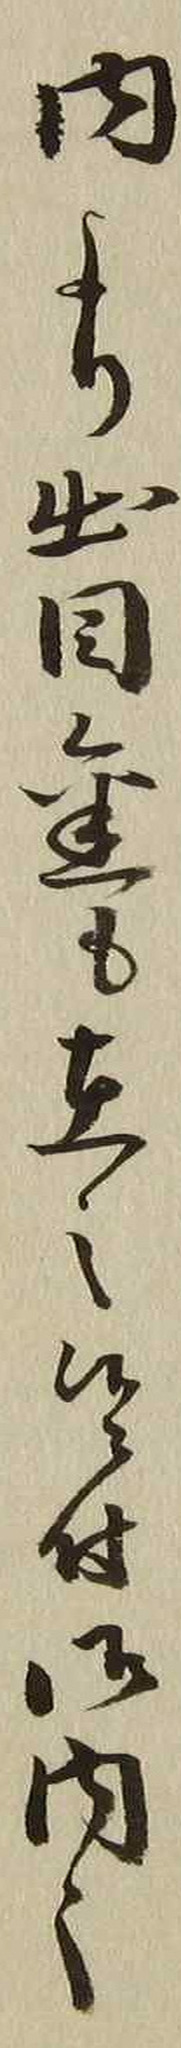内より出目金も在之候ニ付御内々
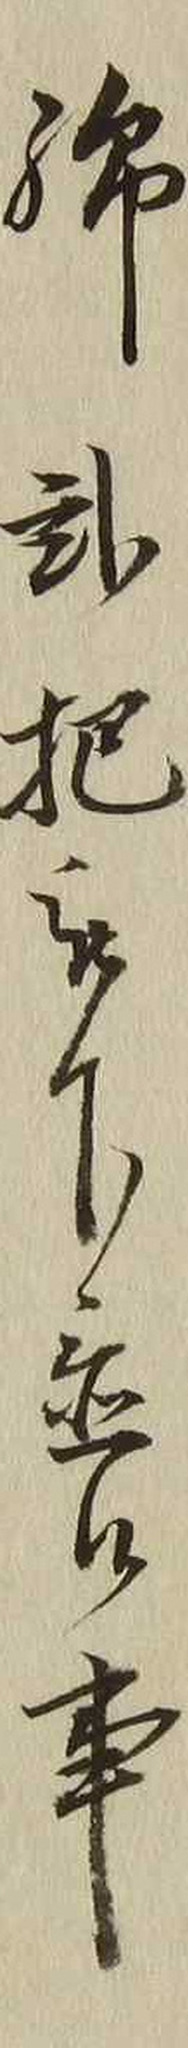綿弐把被下置候事
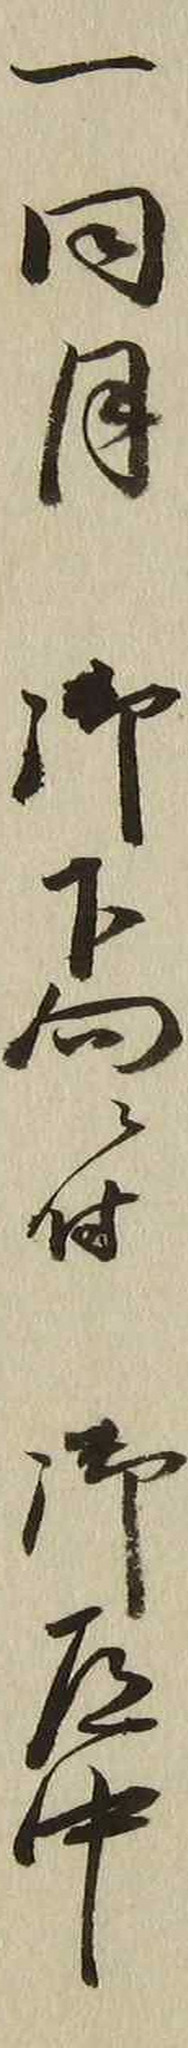一同月御下向ニ付御道中
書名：諸士系譜　巻之61　と之部4
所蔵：会津若松市立会津図書館
